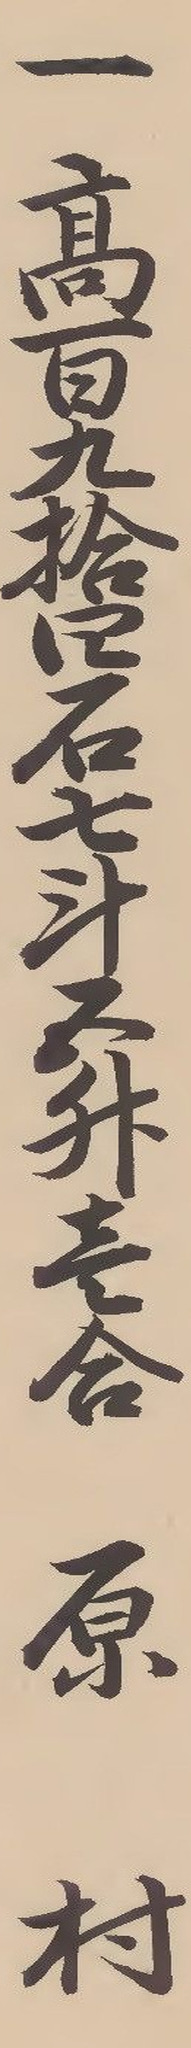一高百九拾四石七斗五升壱合原村
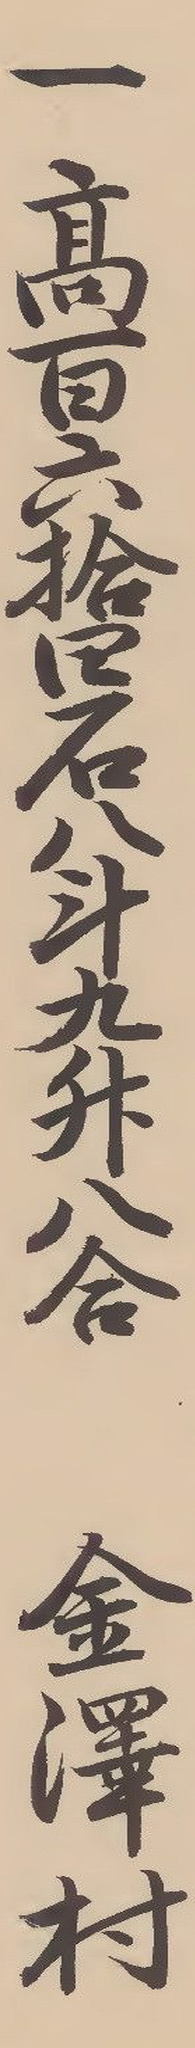一高百六拾四石八斗九升八合金沢村
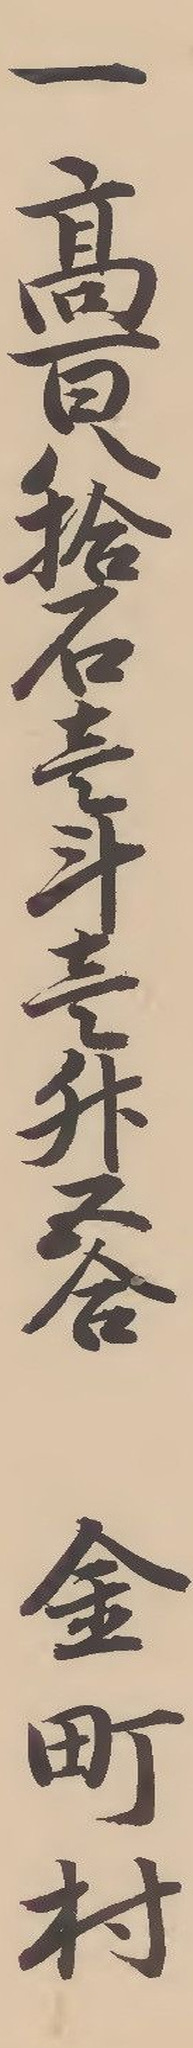一高百八拾石壱斗壱升五合金町村

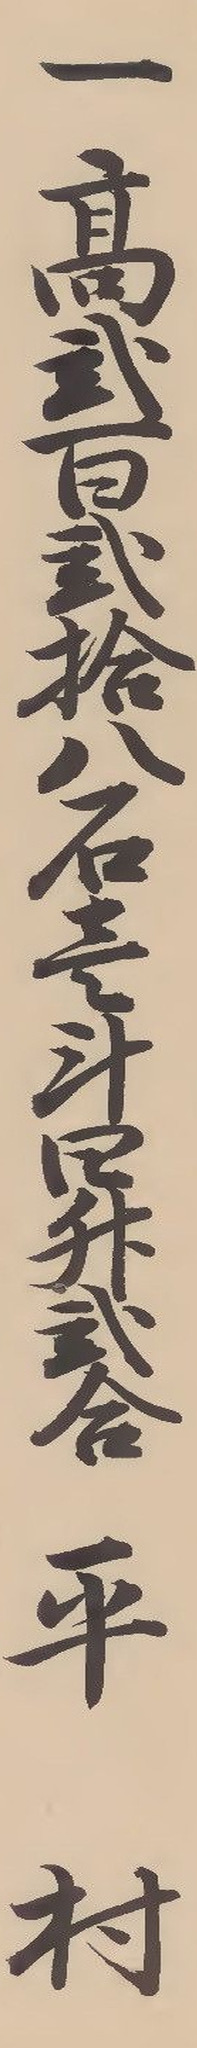一高弐百弐拾八石壱斗四升弐合平村
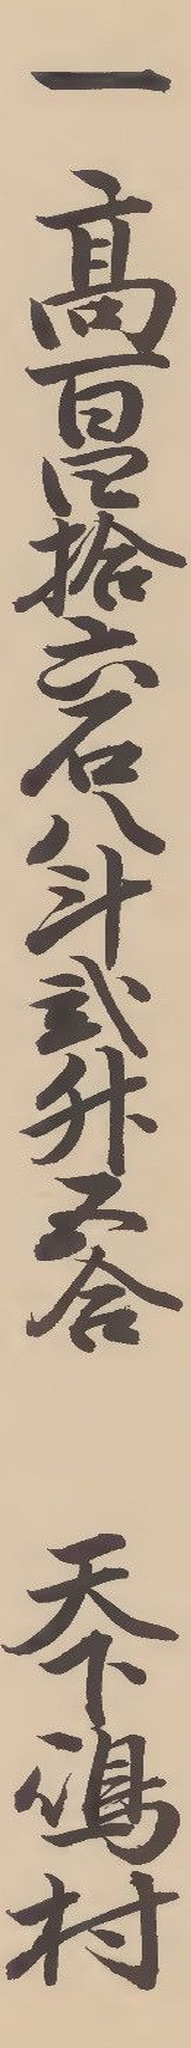一高百四拾六石八斗弐升五合天下島村
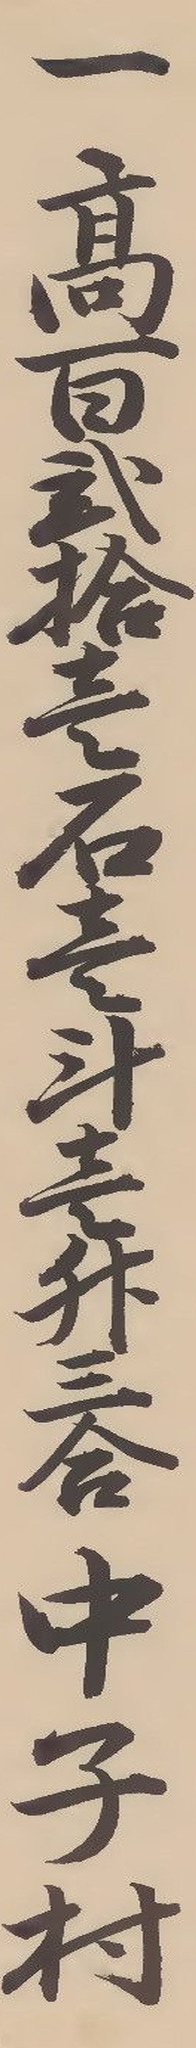一高百弐拾壱石壱斗壱升三合中子村
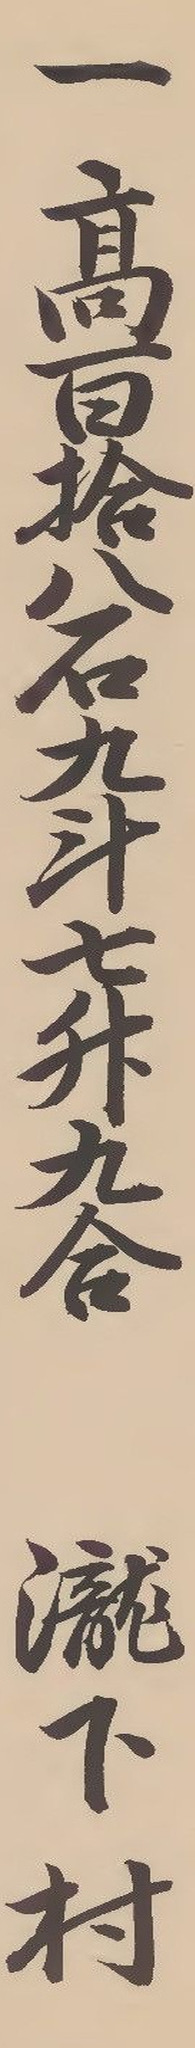一高百拾八石九斗七升九合滝下村
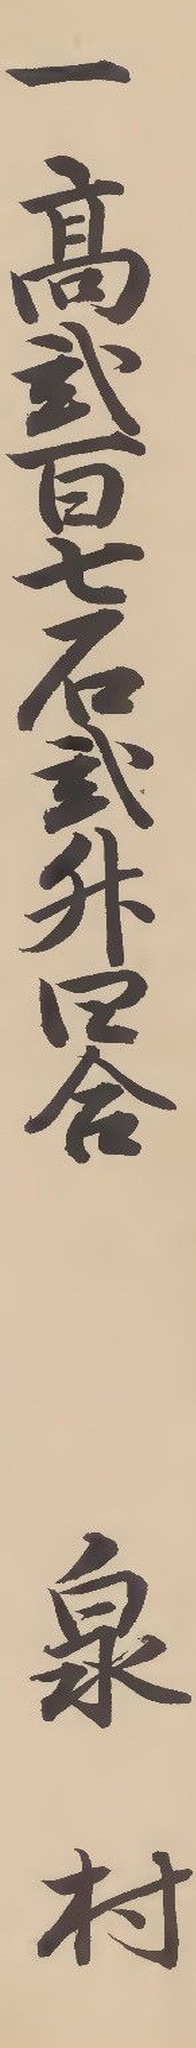一高弐百七石弐升四合泉村
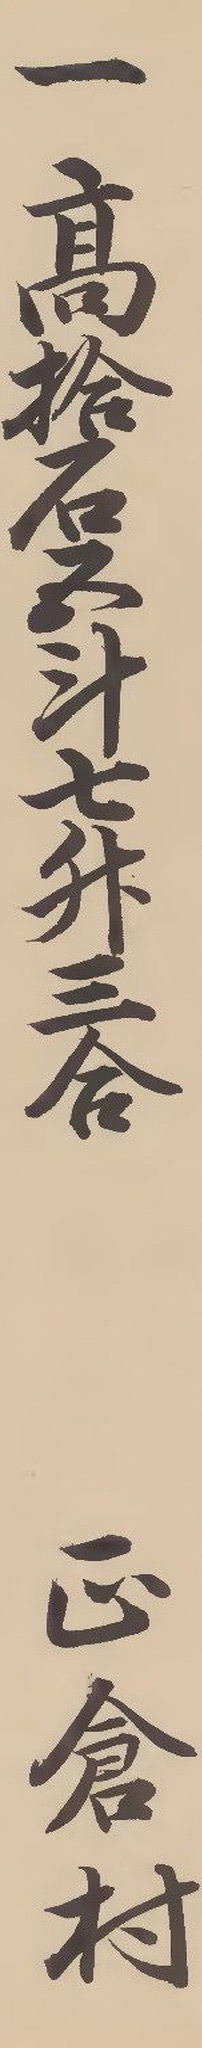一高拾石五斗七升三合正倉村
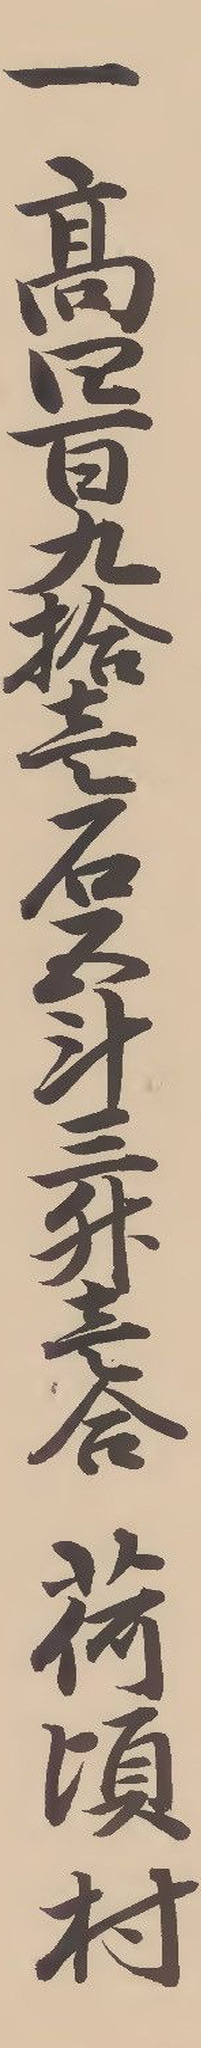一高四百九拾壱石五斗三升壱合荷頃村
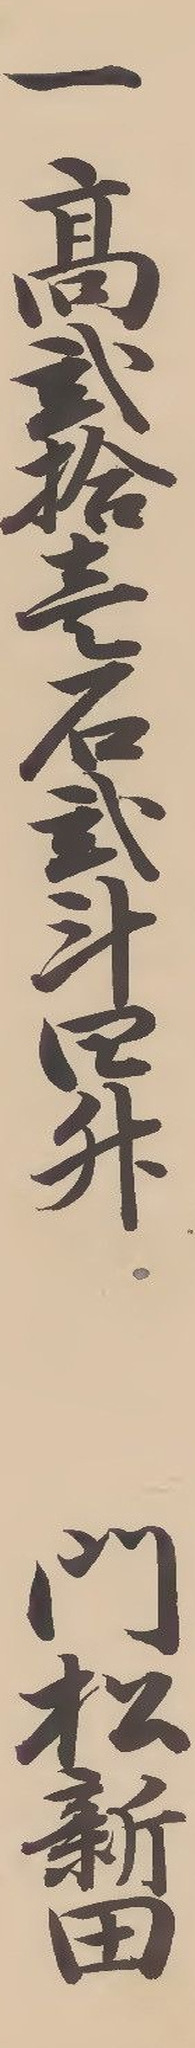一高弐拾壱石弐斗四升門松新田

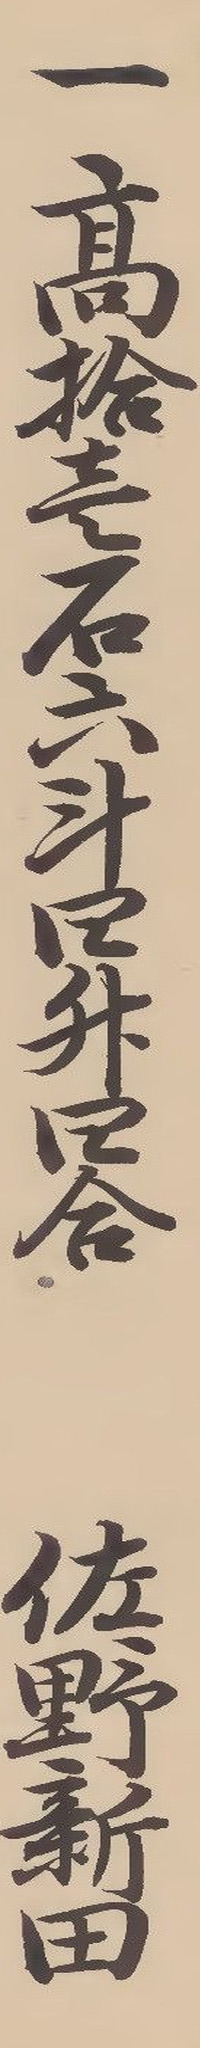一高拾壱石六斗四升四合佐野新田
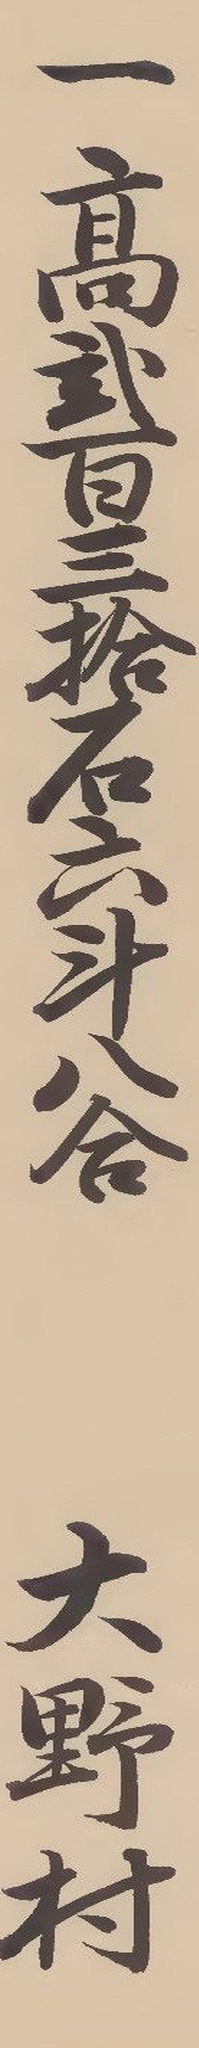一高弐百三拾石六斗八合大野村
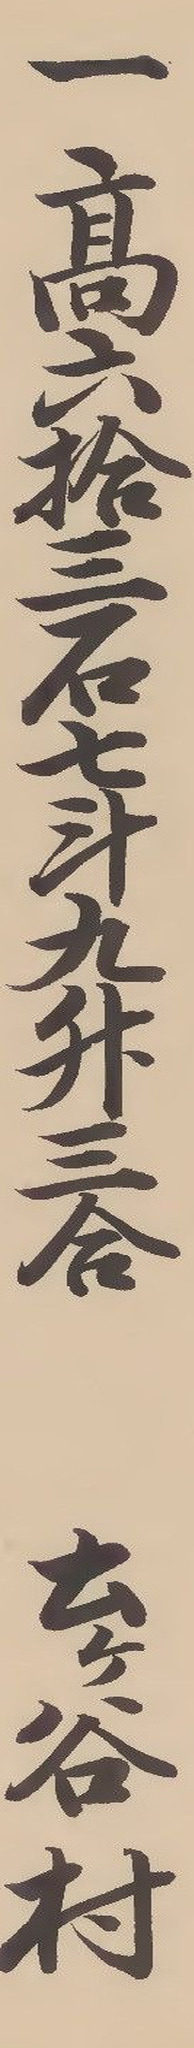一高六拾三石七斗九升三合土ヶ谷村
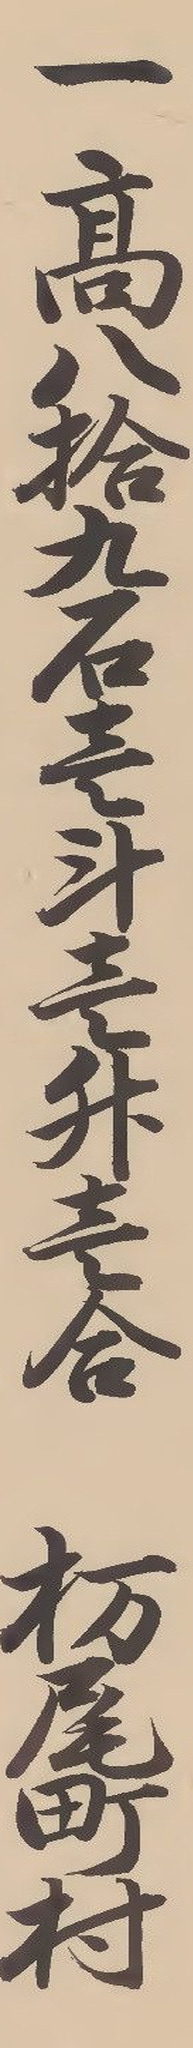一高八拾九石壱斗壱升壱合栃尾町村
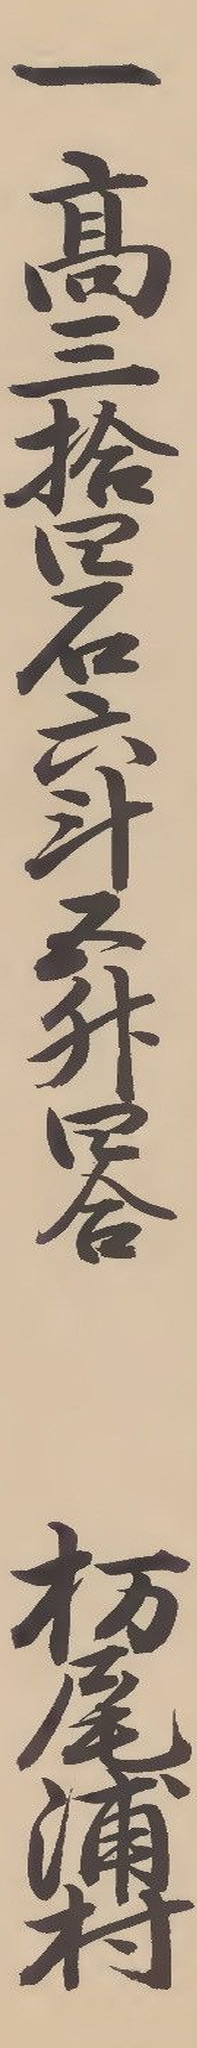一高三拾四石六斗五升四合栃尾浦村
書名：越後国郷帳　中
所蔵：国立公文書館 National Archives of Japan
